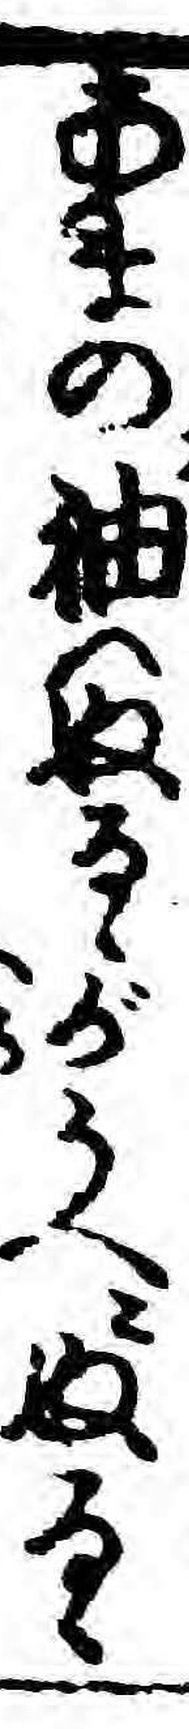あまの袖はぬるゝがうへにぬるゝ
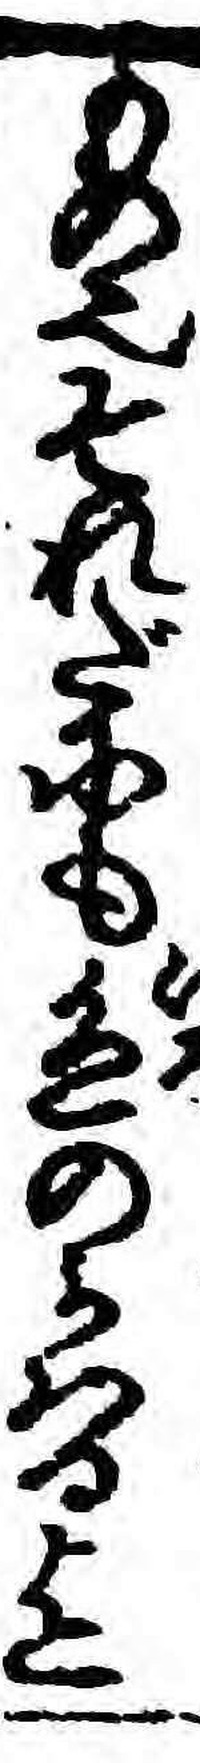もの也それだにも色のかはること
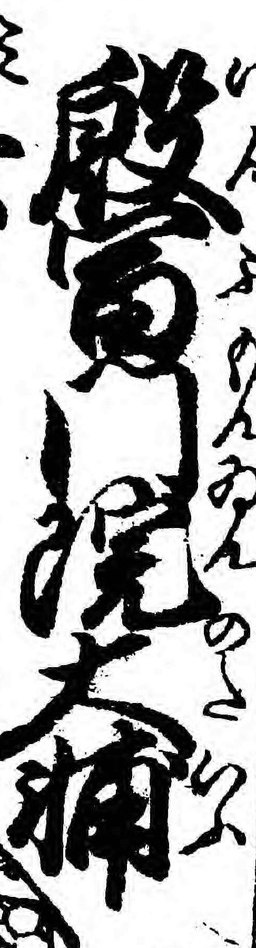殷冨門院大輔
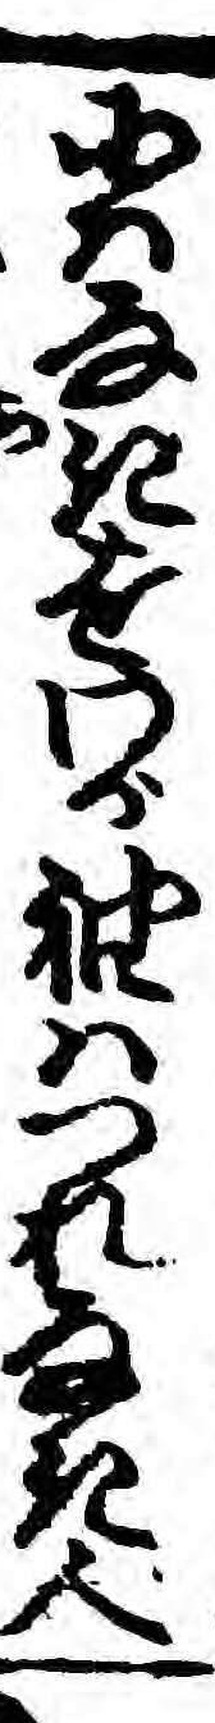にはなきをわが袖はつれなき人
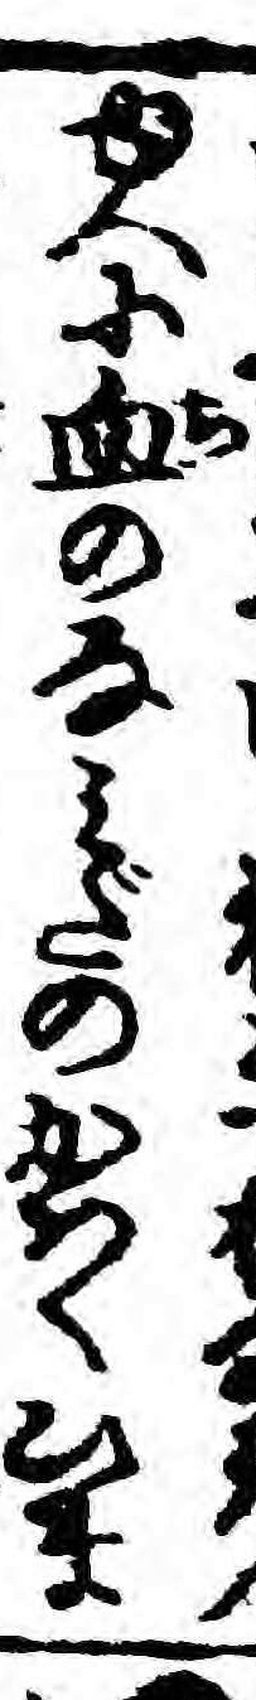ゆへに血のなみだのかはくひま
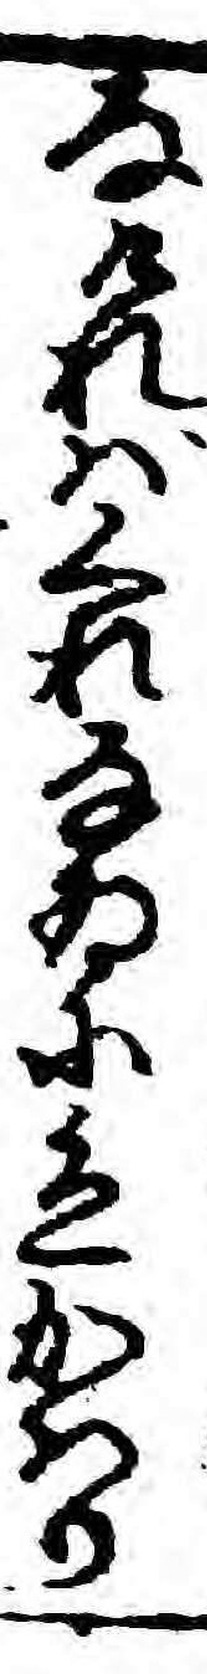なければくれなゐに色かはり
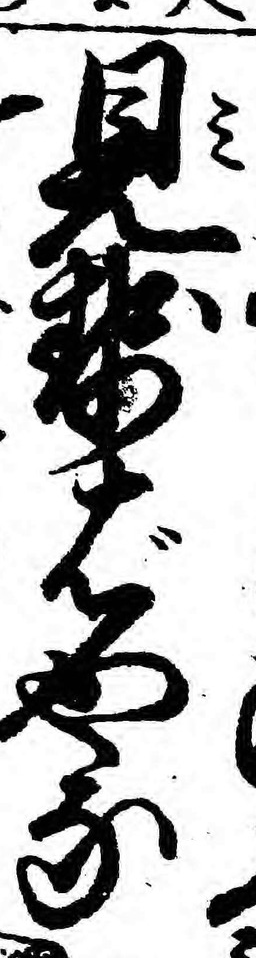見せばやな
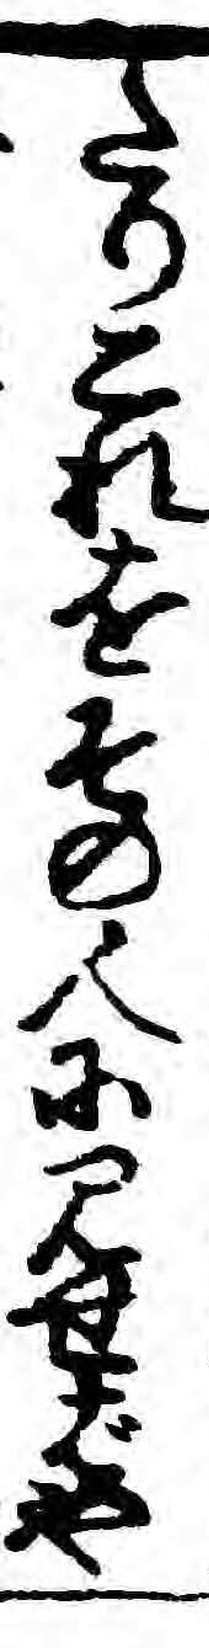たりこれをその人に見せばや
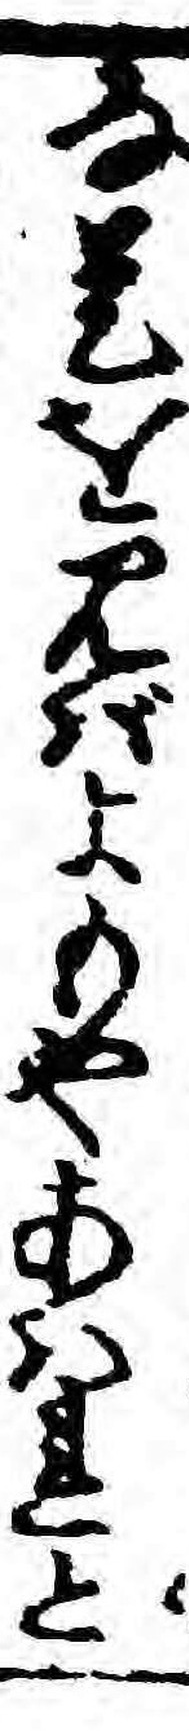な是を見ばよもやあはれと
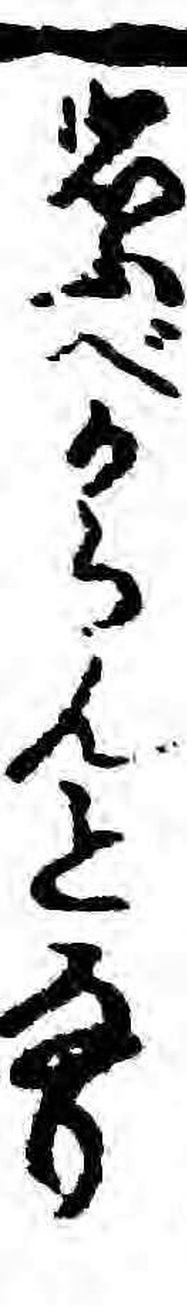思ふべからんとなり
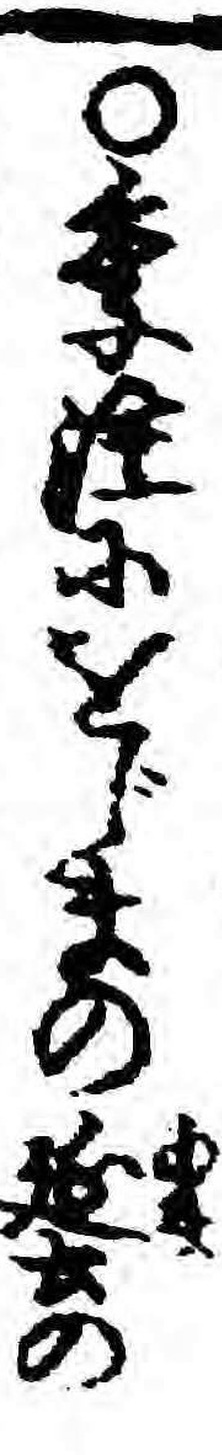〇季注にをじまの蜑の
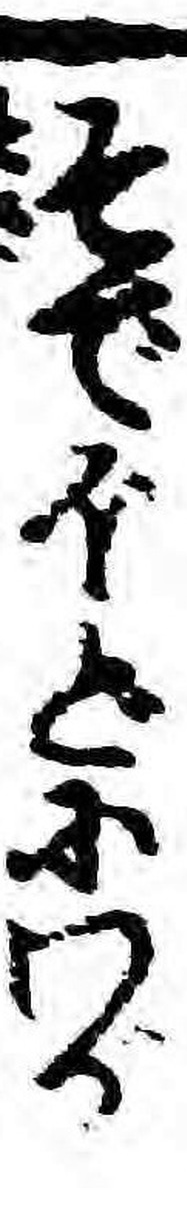そでほとにわが
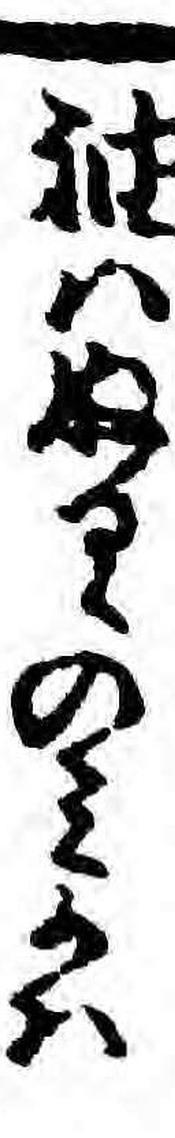袖はぬるゝのみかは
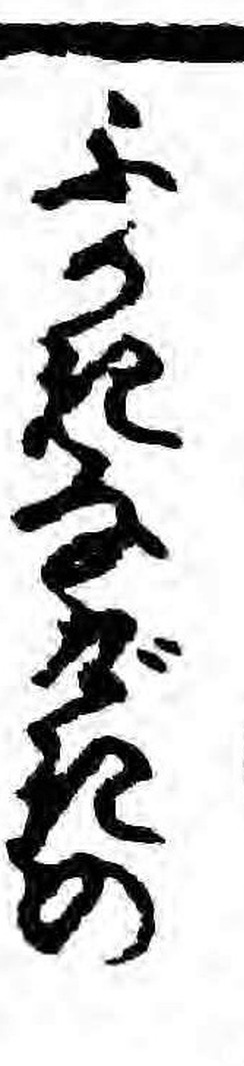ふかきなげきの
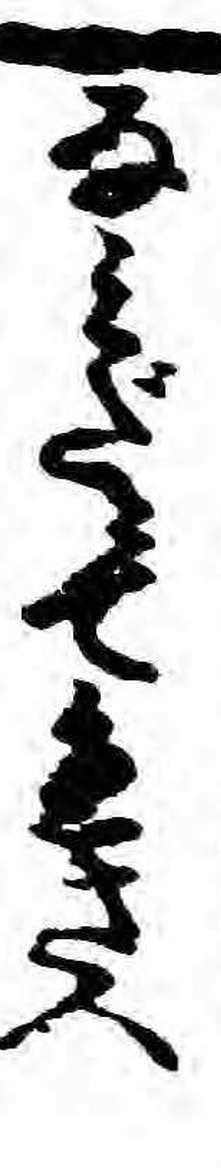なみだにて色さへ
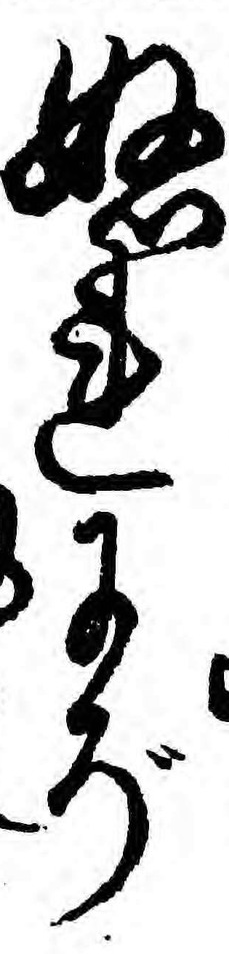ぬれにぞ
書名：頭書和歌注譯／壽賀多百人一首小倉錦
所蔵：国文学研究資料館
